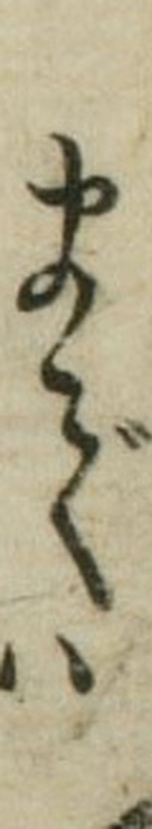までは
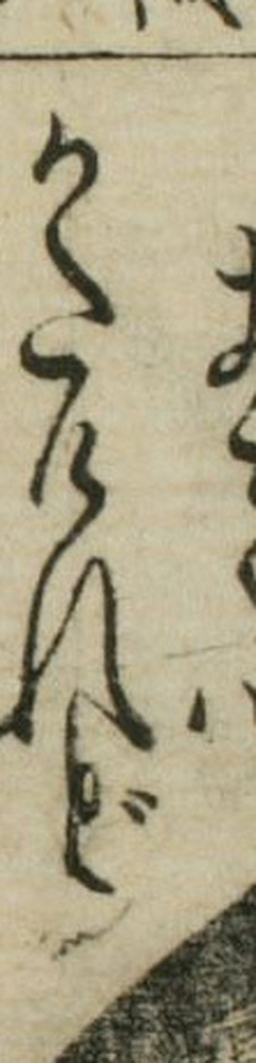かたけれど
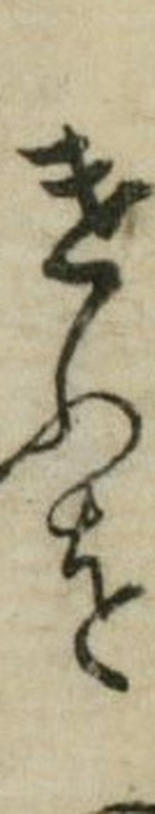けふを
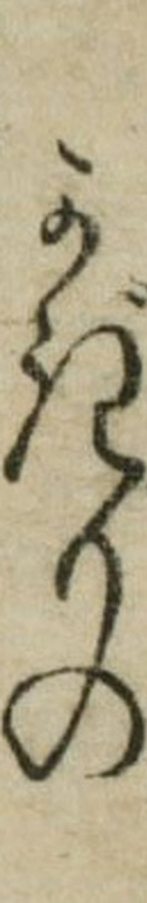かぎりの
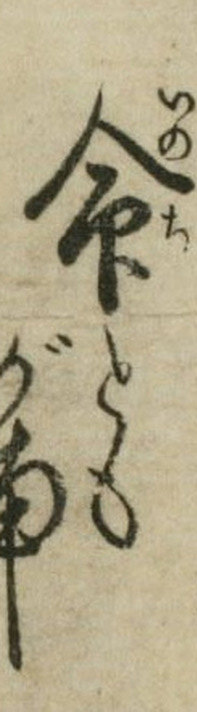命とも
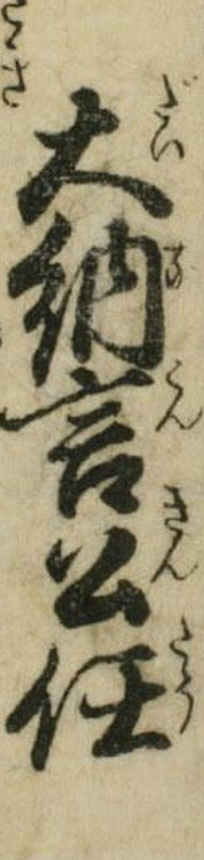大納言公任
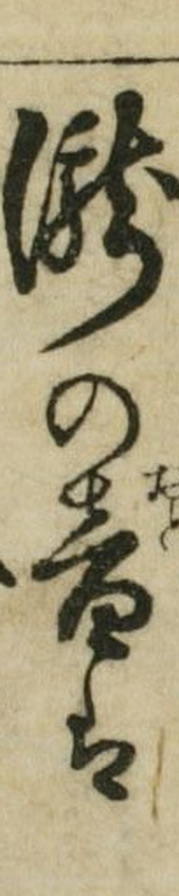滝の音は
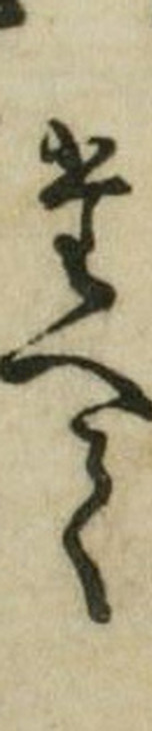たへて
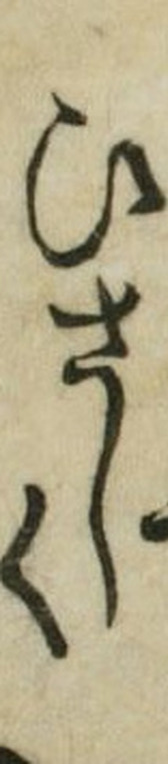ひさしく
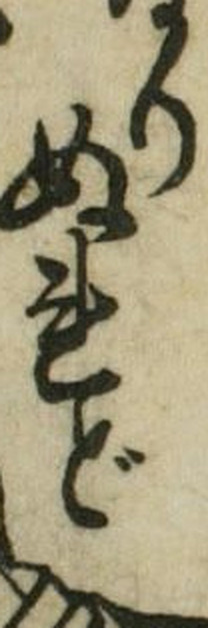ぬれど
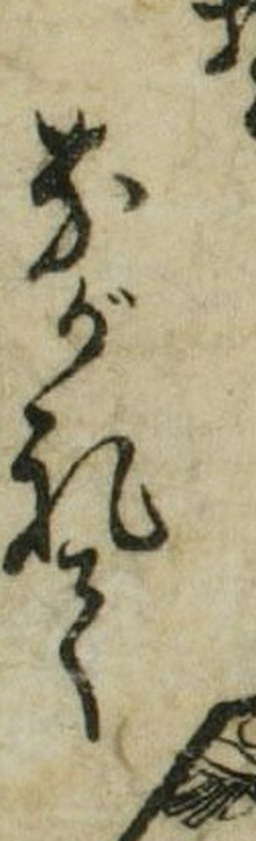ながれて
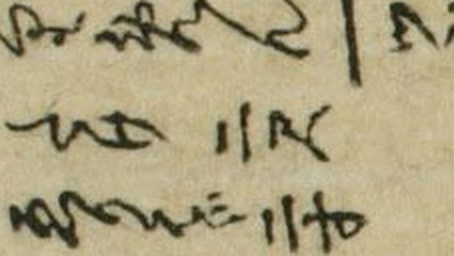たけ弐尺
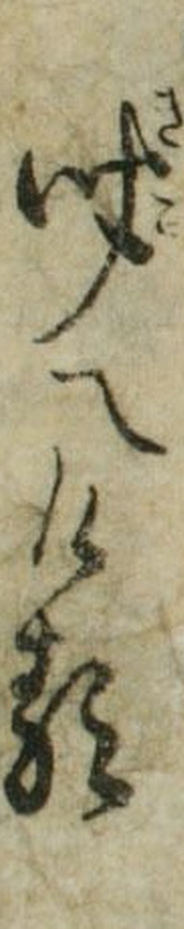聞へける

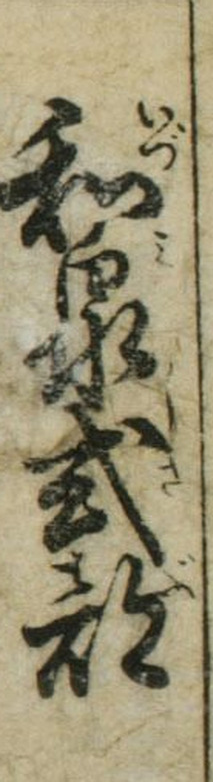和泉式部
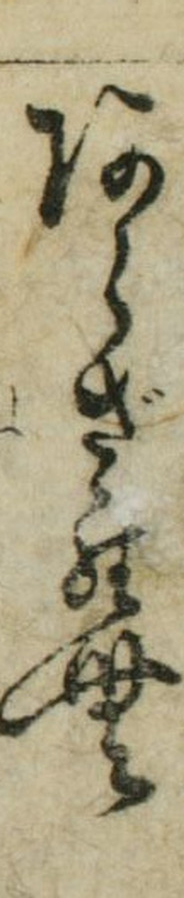あらざらむ
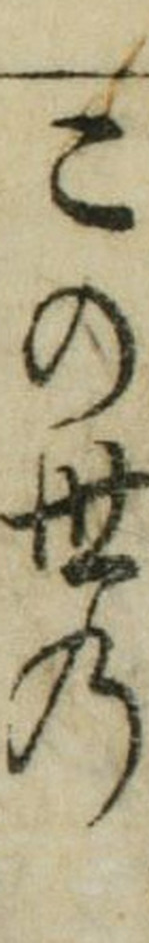この世の
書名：百人一首
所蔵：東京学芸大学教育コンテンツアーカイブ
